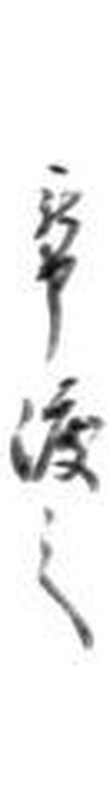被申渡之
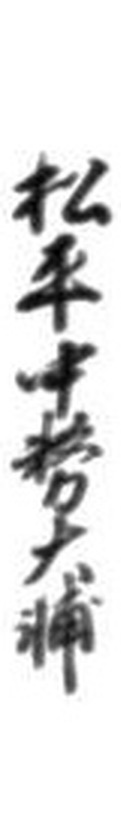松平中務大輔
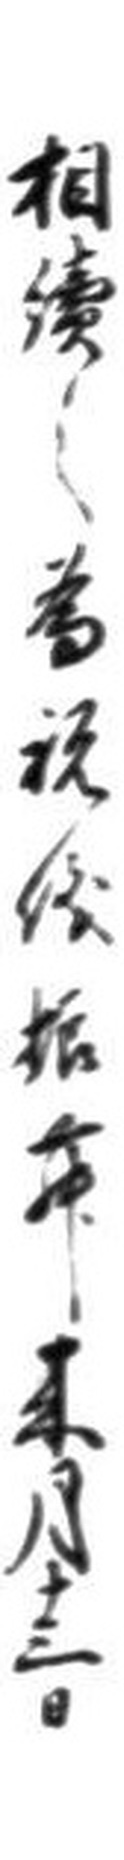相続之為祝儀振舞来月十三日
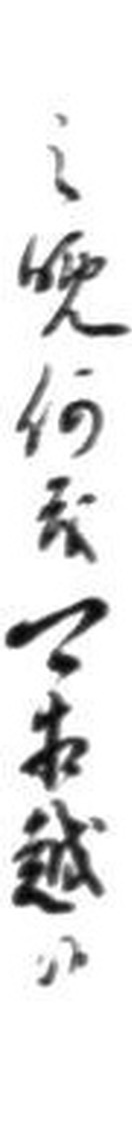之晩何茂可相越候

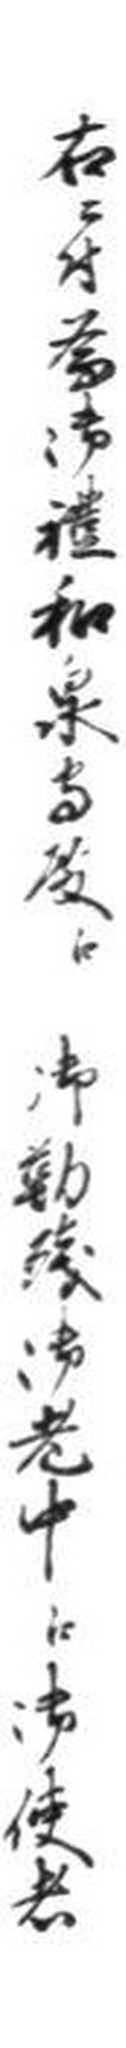右ニ付為御礼和泉守殿江御勤残御老中江御使者
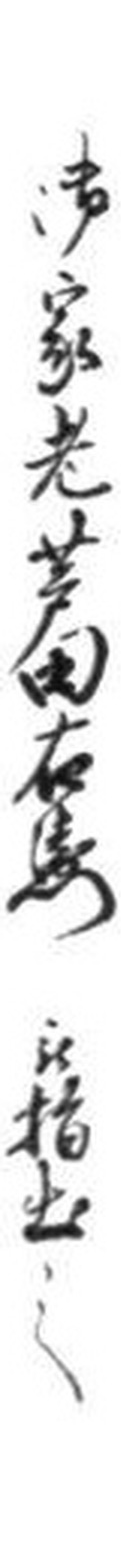御家老芦田右衛門被指出之
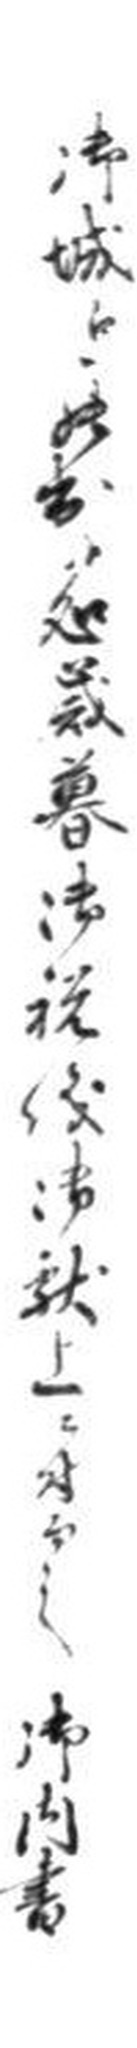御城江罷出候処歳暮御祝儀御献上ニ付而之御内書
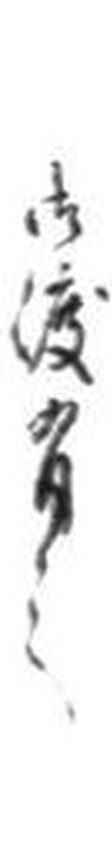御渡有之
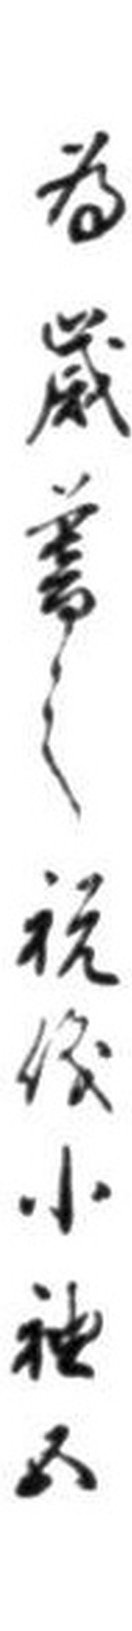為歳暮之祝儀小袖五
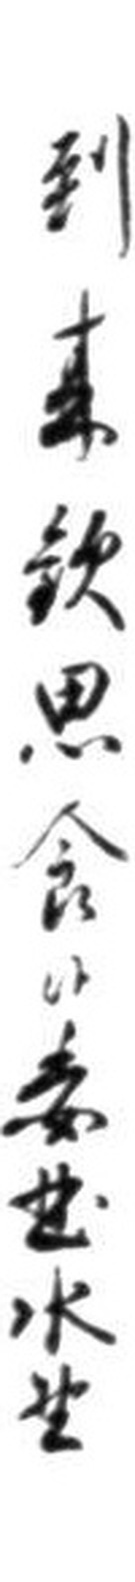到来歓思食候委曲水野
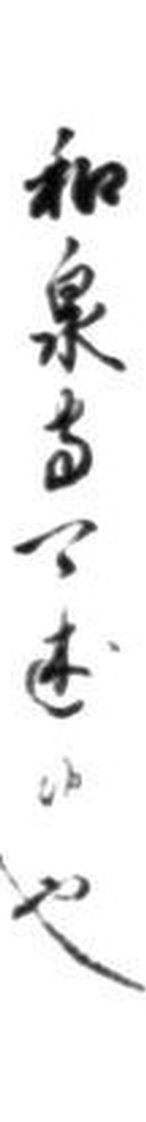和泉守可述候也
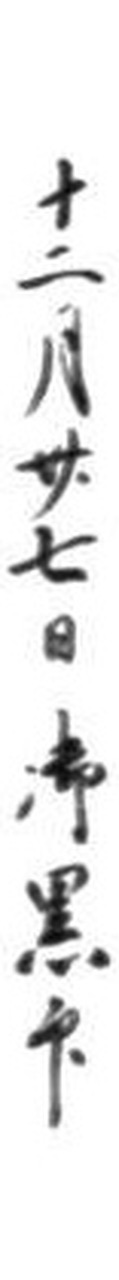十二月廿七日御黒印
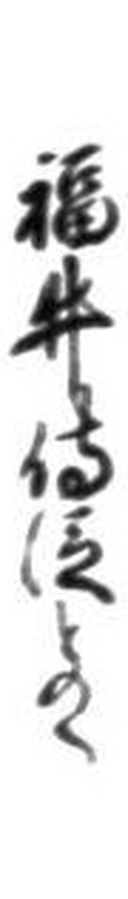福井侍従とのへ
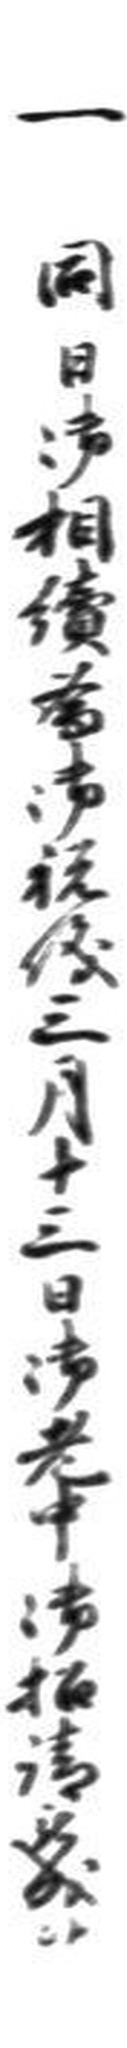一同日御相続為御祝儀三月十三日御老中御招請被成候
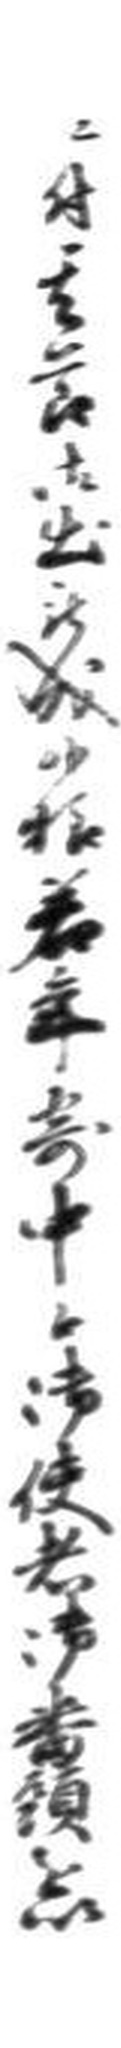ニ付其節御出被成候様若年寄中江御使者御番頭を以
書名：家譜 三十五 宗昌公 従享保六年到同七年
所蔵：福井県文書館 Fukui Prefectural Archives
